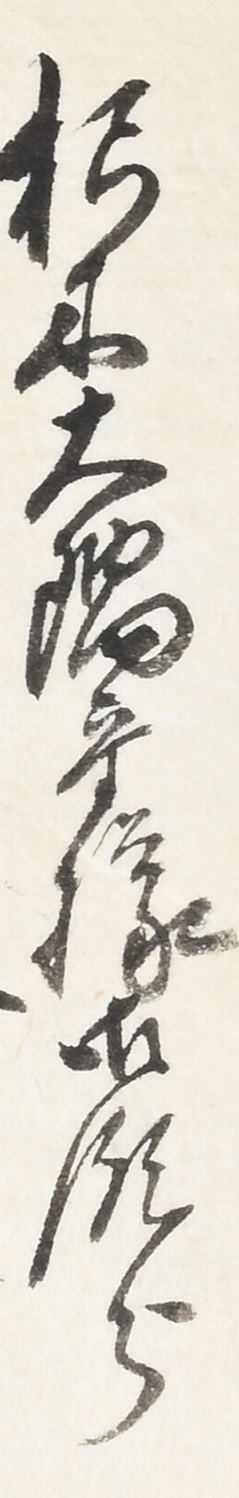朽木大隅守様御領分
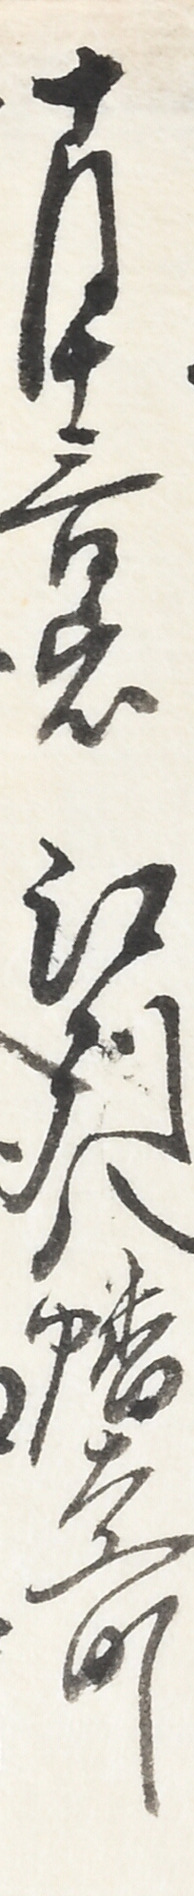十月十三日着江州八幡大工町
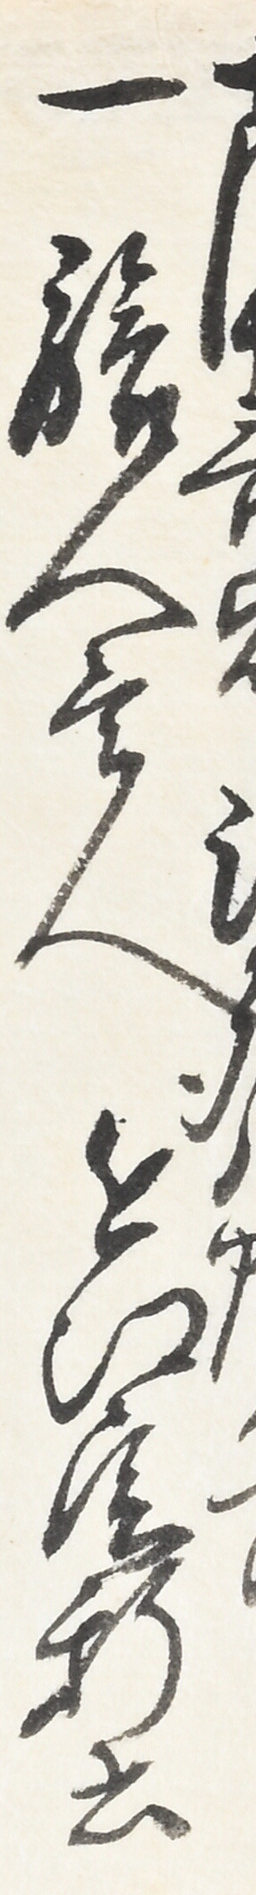一旅人壱人近江屋新六
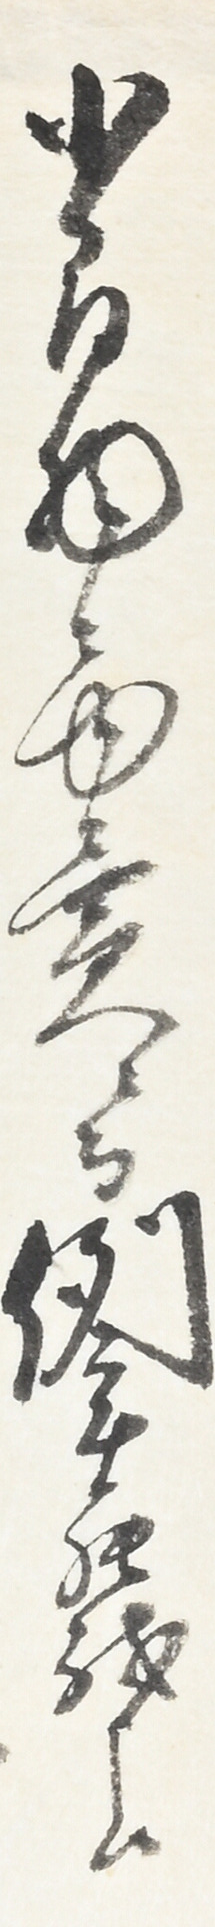小間物商売ニ而例年罷越申候
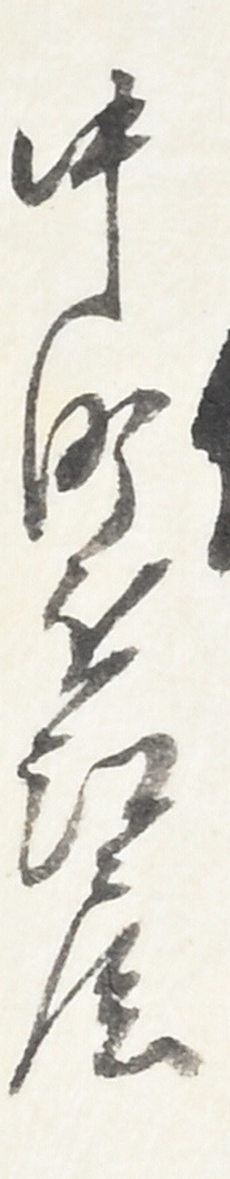中町近江屋
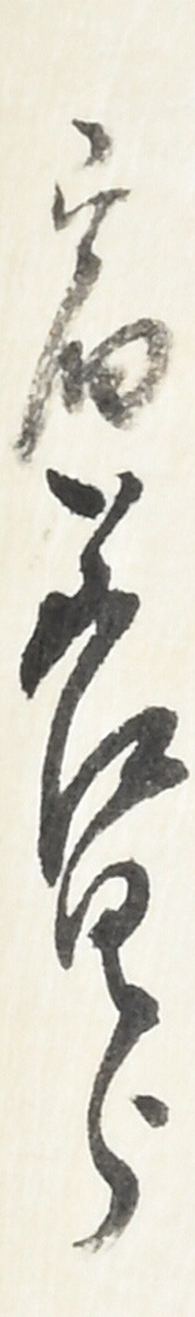宿善四郎
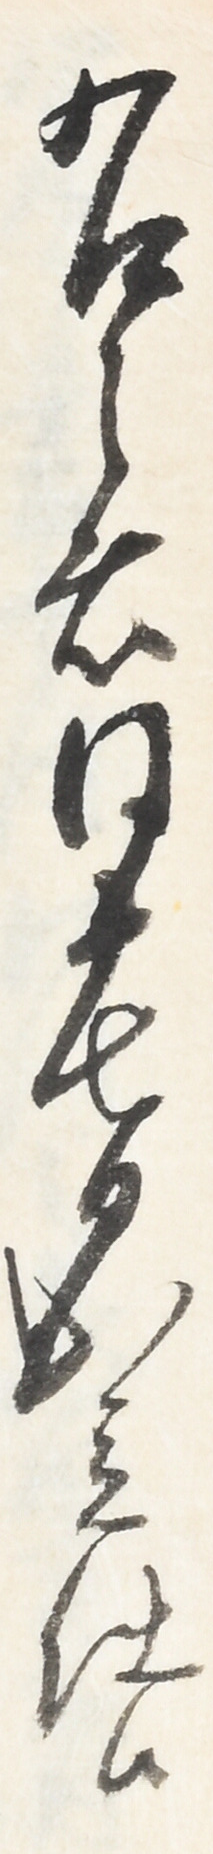右之者同十三日出立仕候
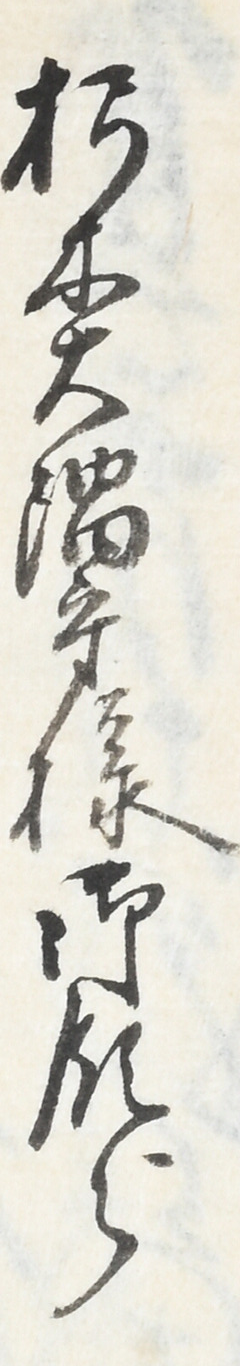朽木大隅守様御領分

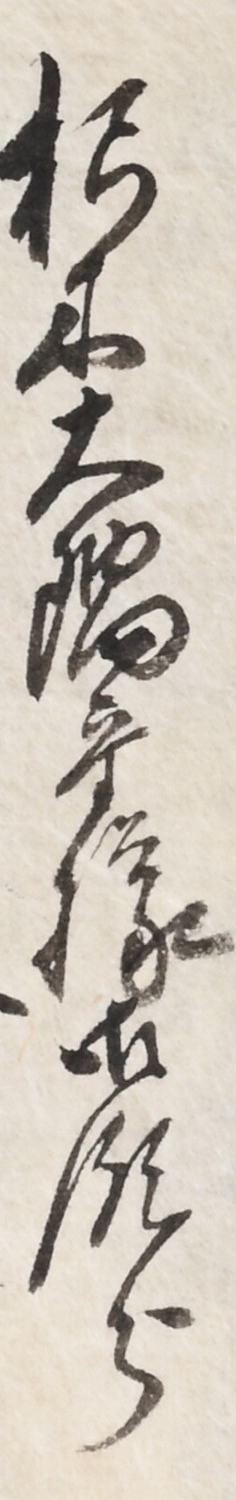朽木大隅守様御領分
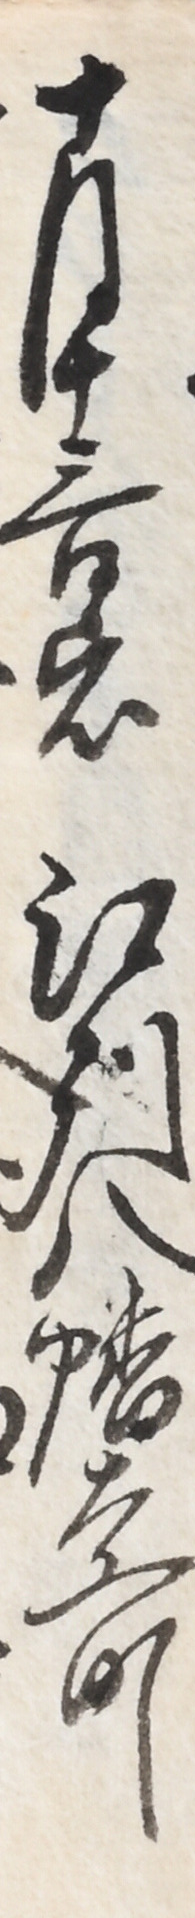十月十三日着江州八幡同心町
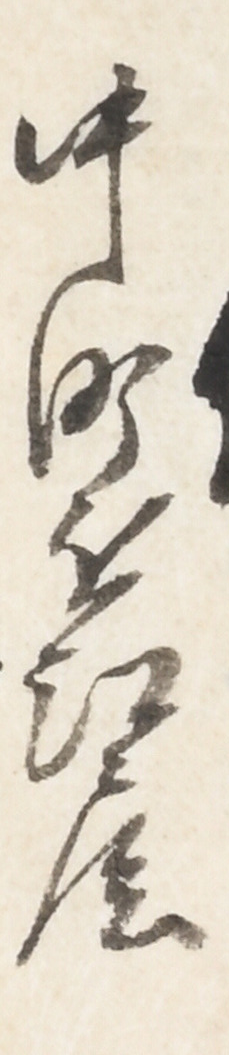中町近江屋
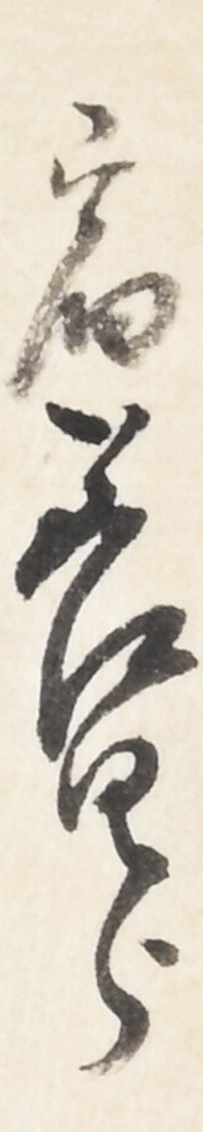宿善四郎
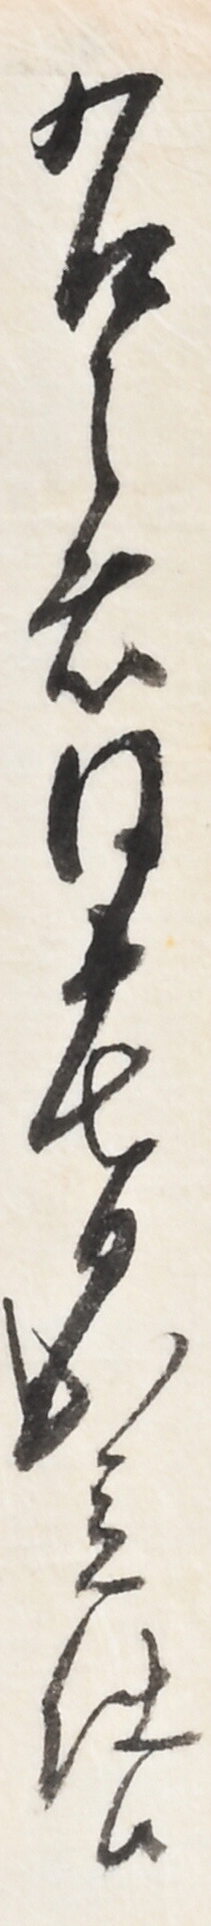右之者同十七日出立仕候
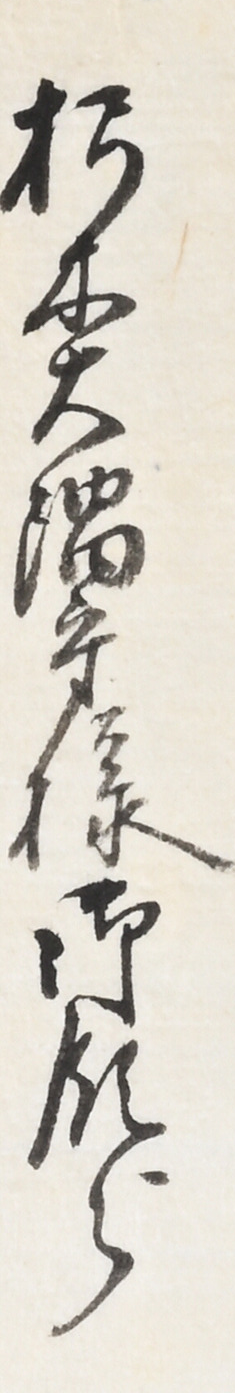朽木大隅守様御領分
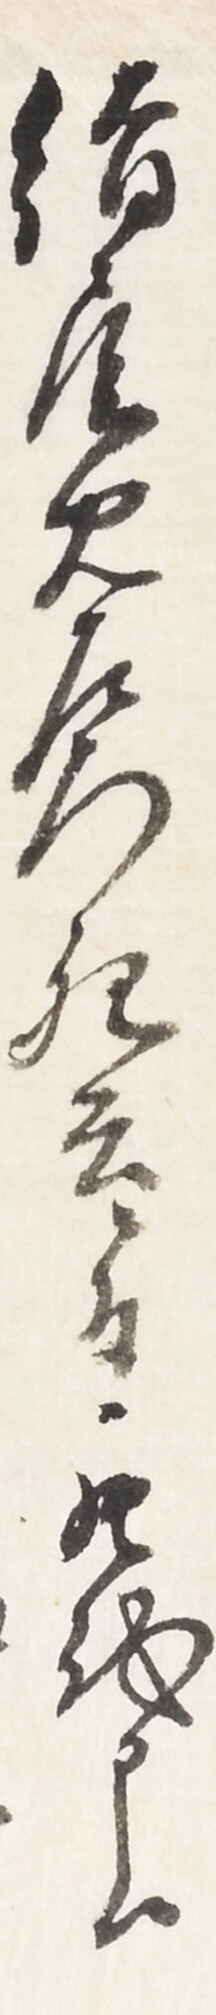絹屋忠左衛門死去ニ付罷越申候
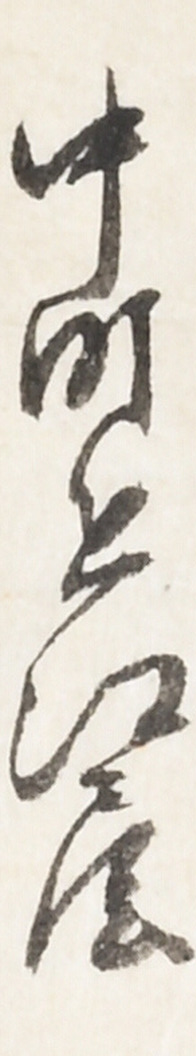中町近江屋
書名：旅人泊控帳
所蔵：伊那市立高遠町図書館・合同会社AMANE
